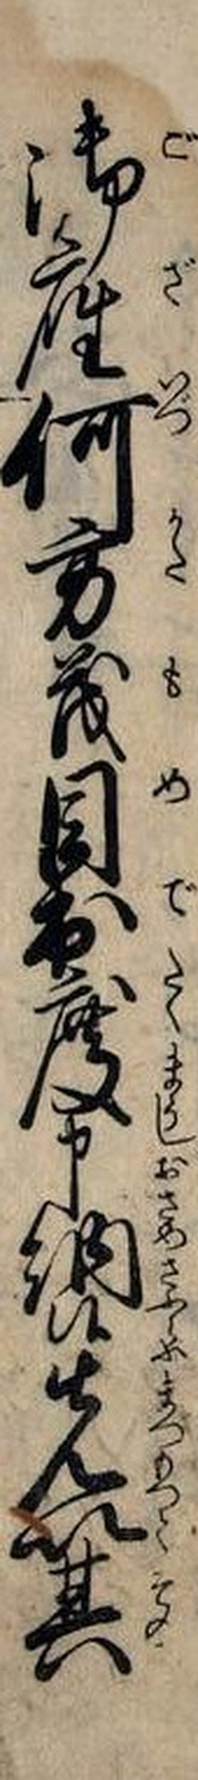御座何方も目出度申納候先以其
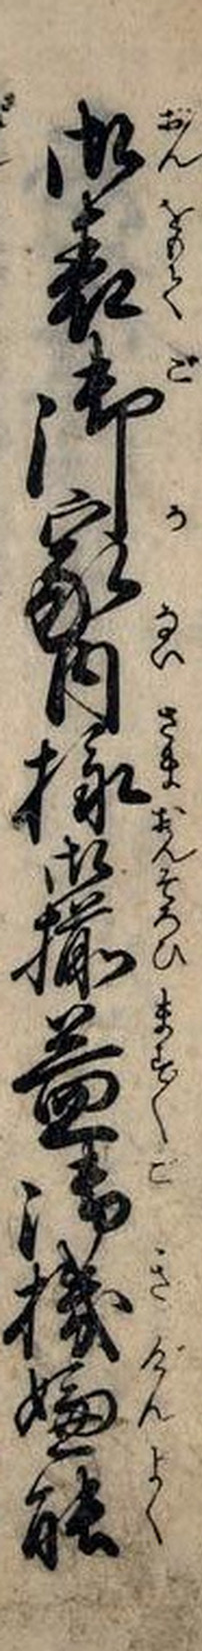御表御家内様御揃益御機嫌能

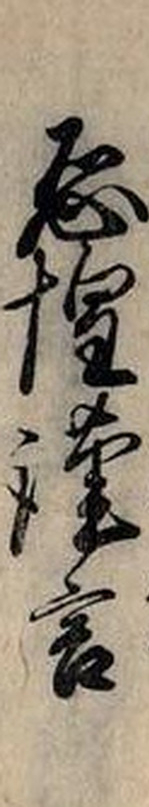恐惶謹言
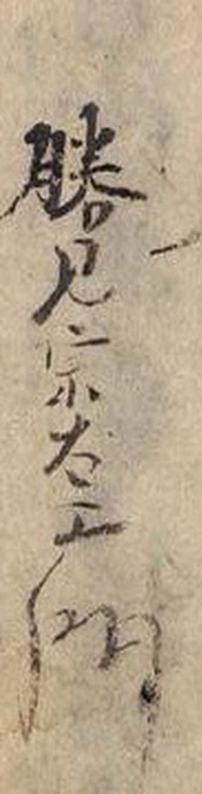勝見宗太エ門
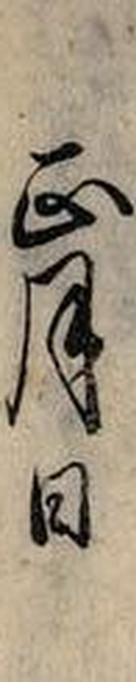正月日
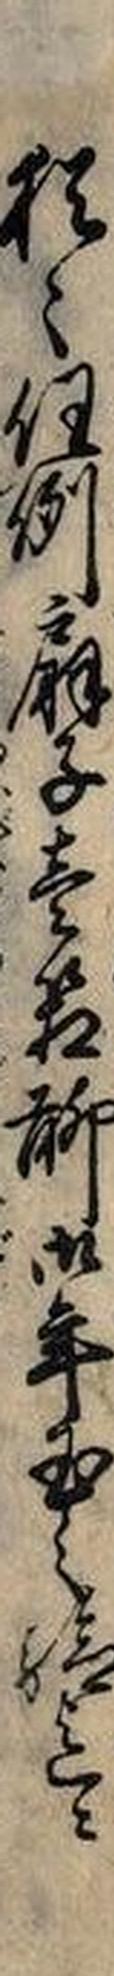猶々任例扇子壱箱聊御年玉之験迄に
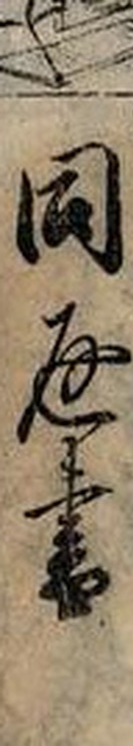同返書
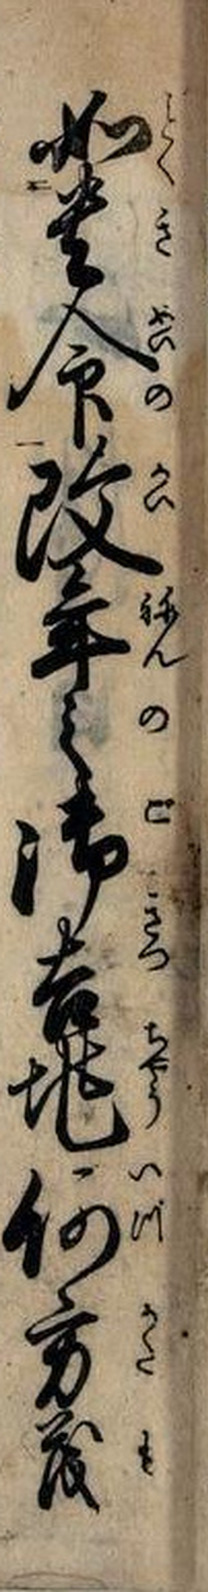如貴命改年之御吉兆何方も
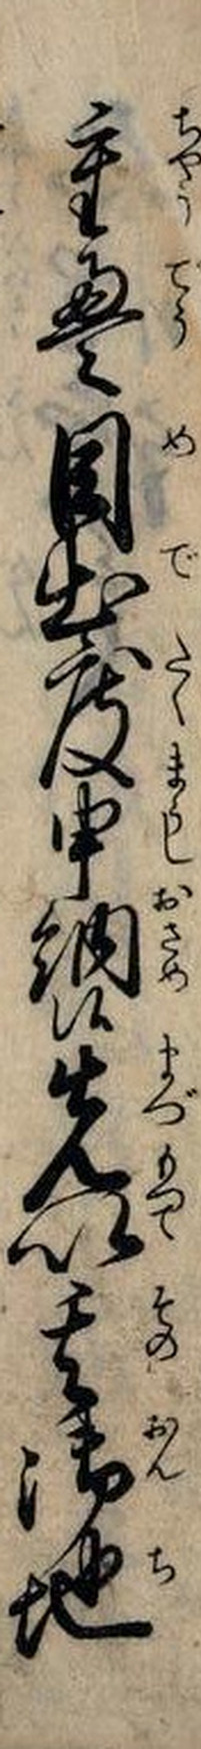重畳目出度申納候先以其御地
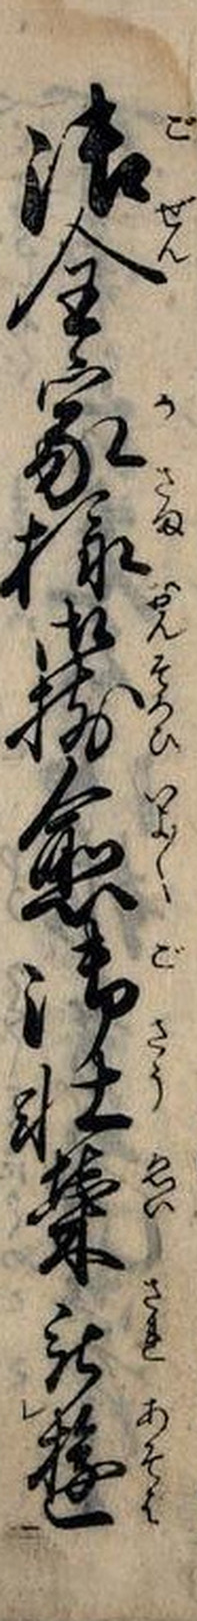御全家様御揃愈御壮栄被遊

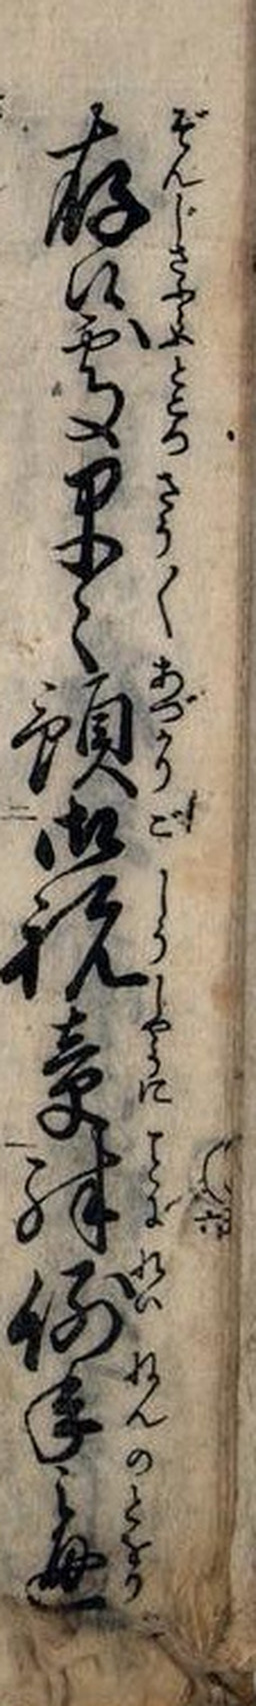存候処早々預御祝章殊例年之通
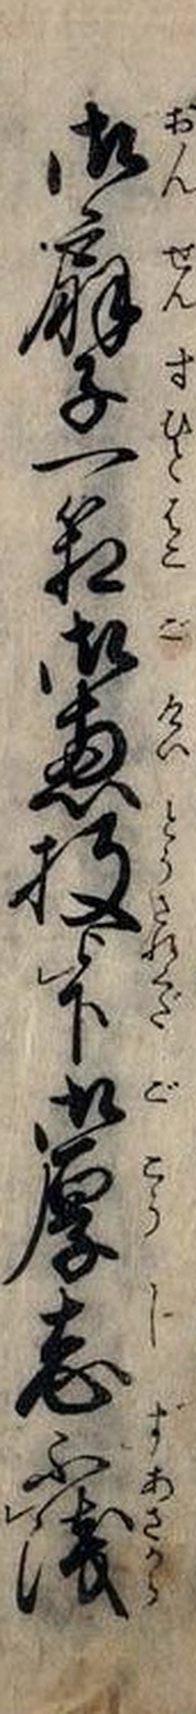御扇子一箱御恵投被下御厚志不浅
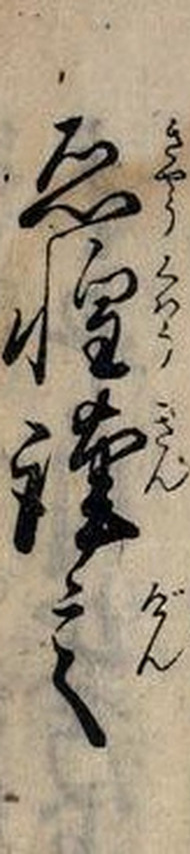恐惶謹言
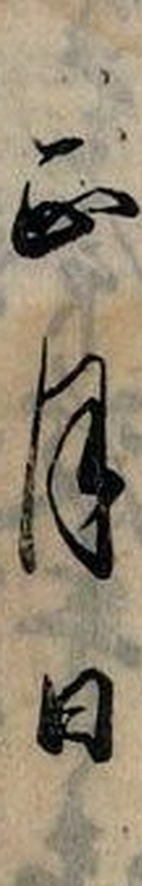正月日
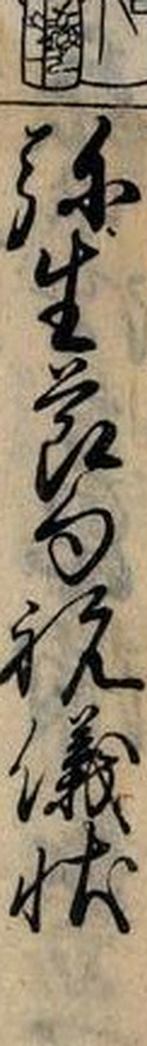弥生節句祝儀状
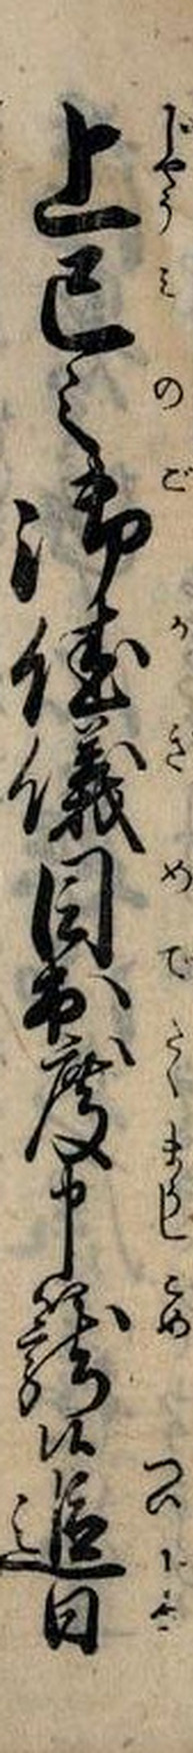上巳之御佳儀目出度申籠候追日
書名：大成用文章（往来物）
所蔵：福井県文書館 Fukui Prefectural Archives
